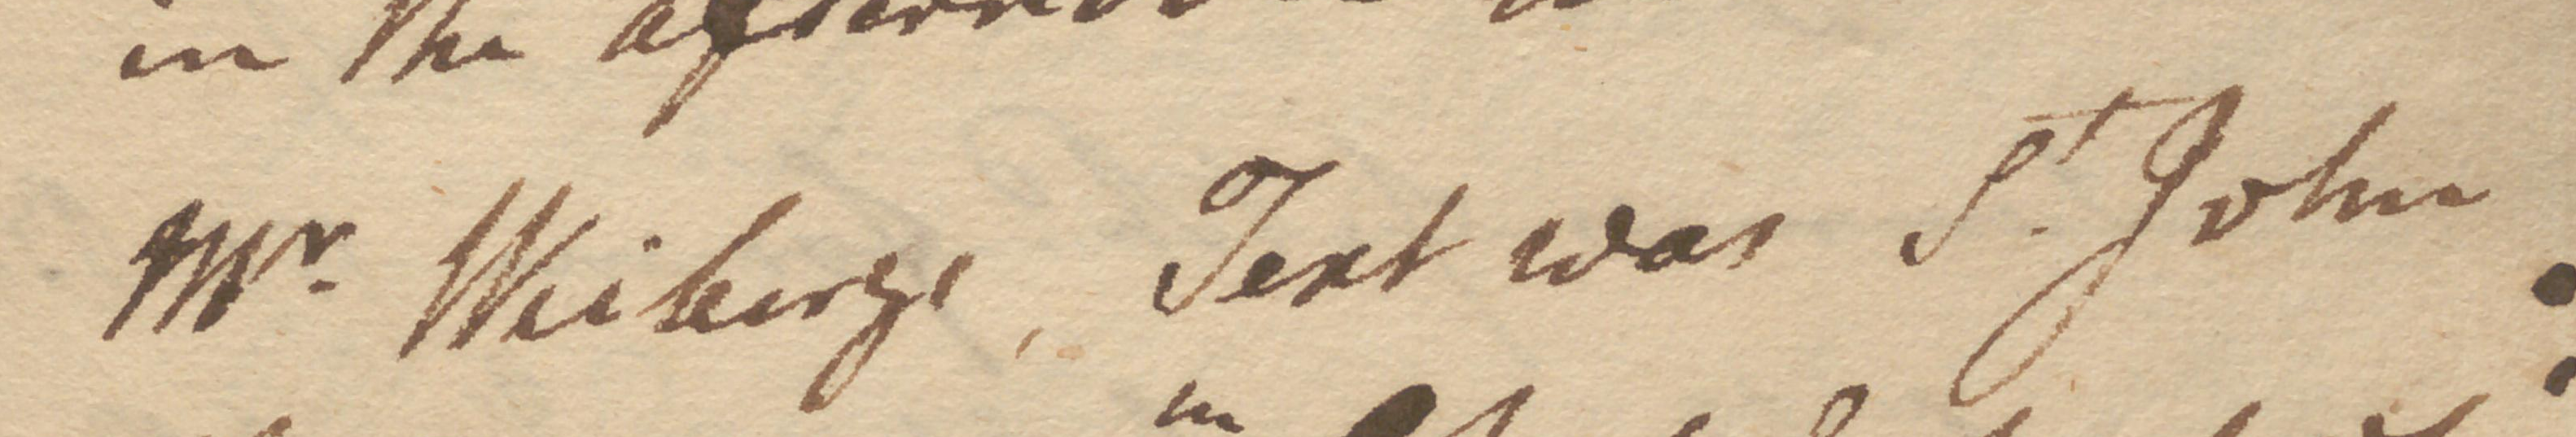M^r. Weibergs Text was S^t. John
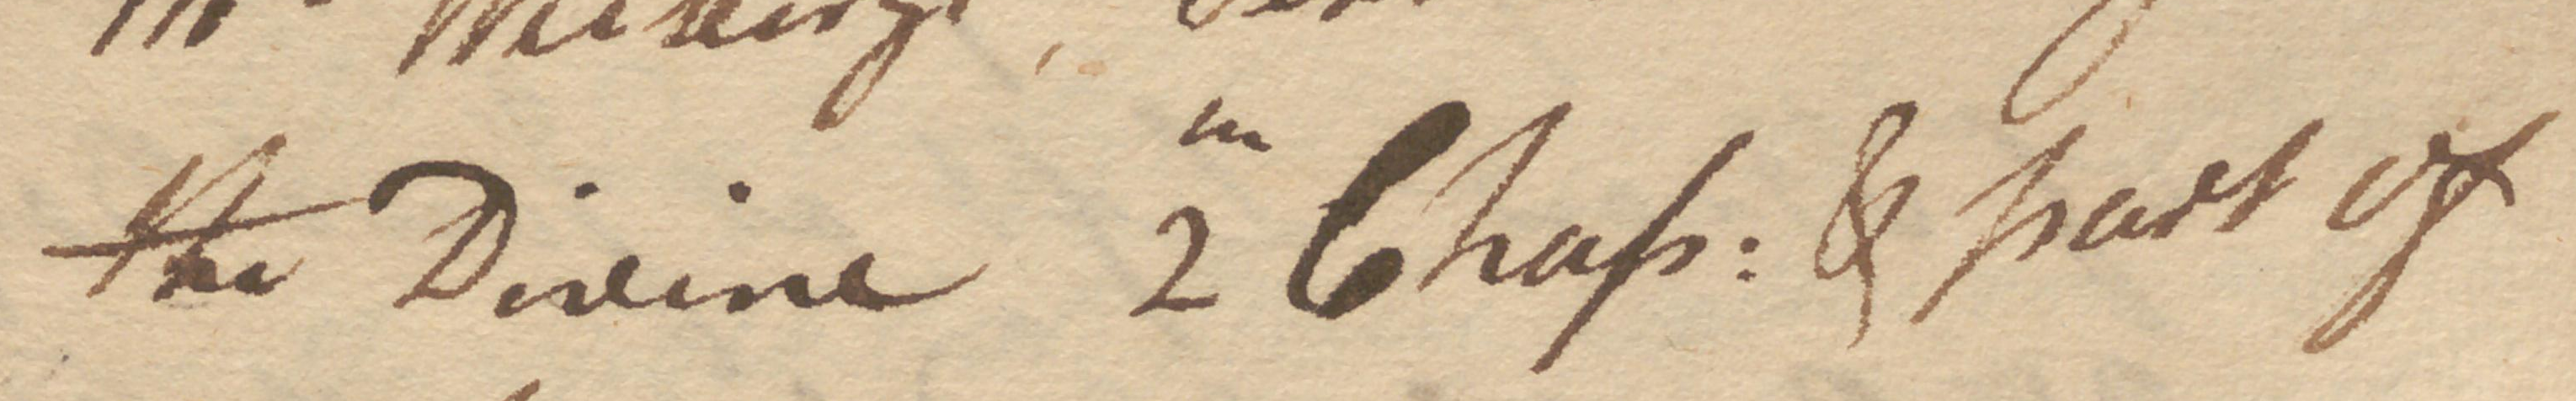the Divine, 2^th Chap: & part of
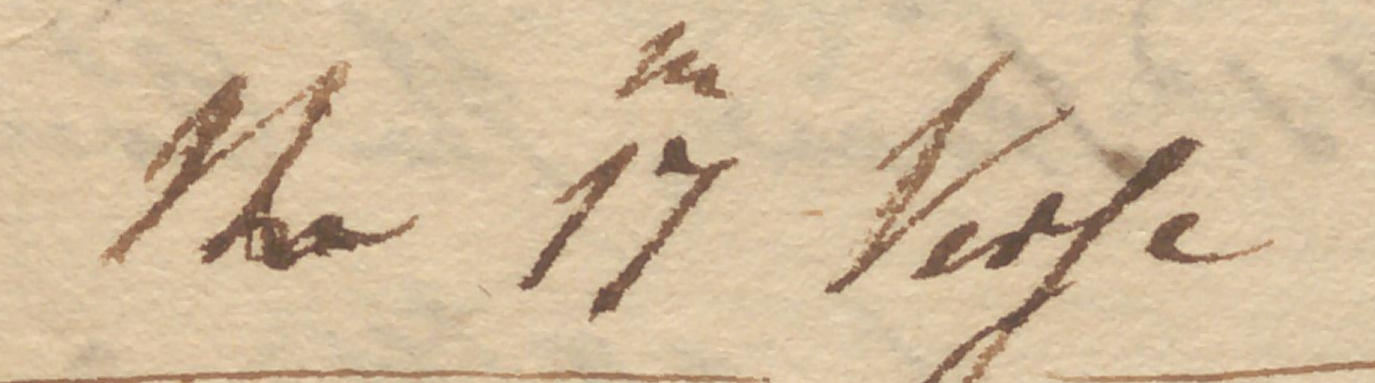the 17^th Verse
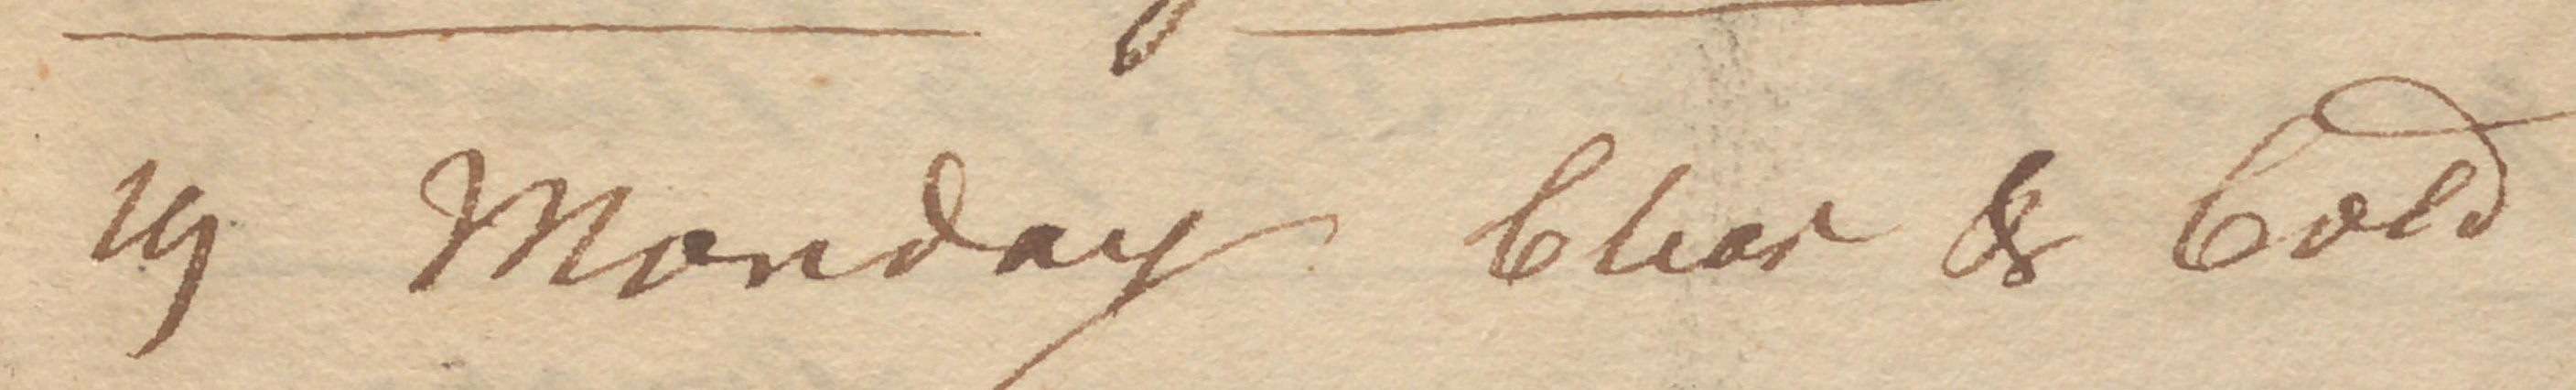19 Monday Clear & Cold
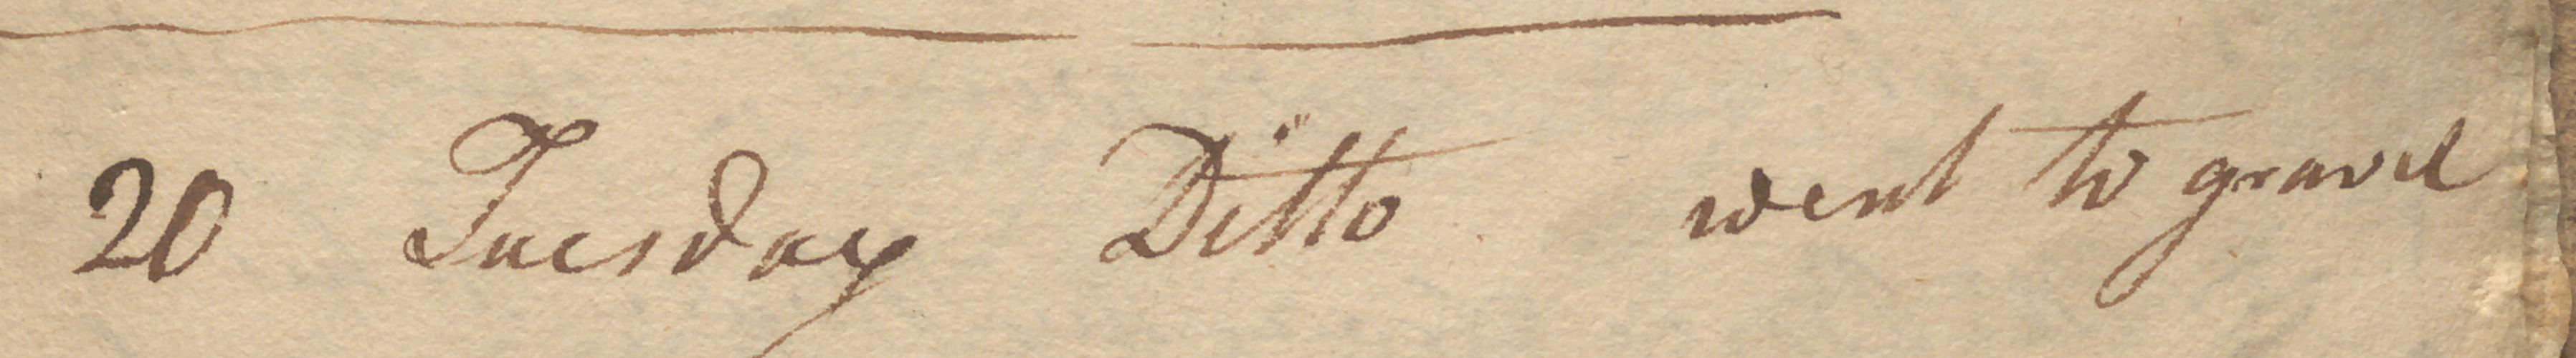20 Tuesday Ditto went to gravel
